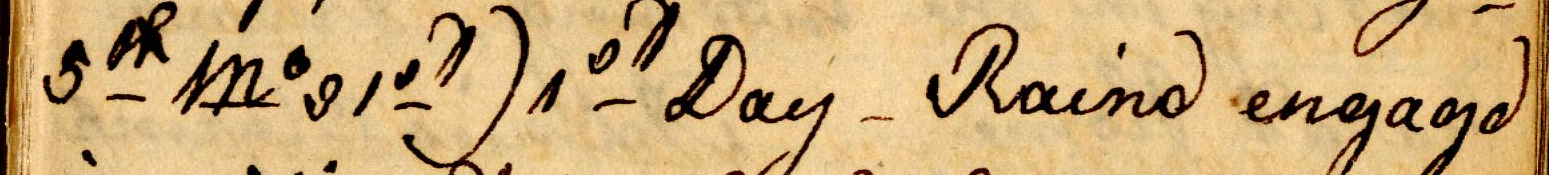5^th M^o 31^st) 1^st Day- Raind engagd
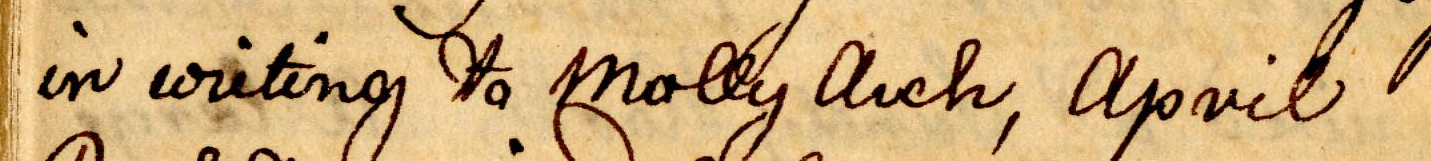in writing to Molly Arch, April
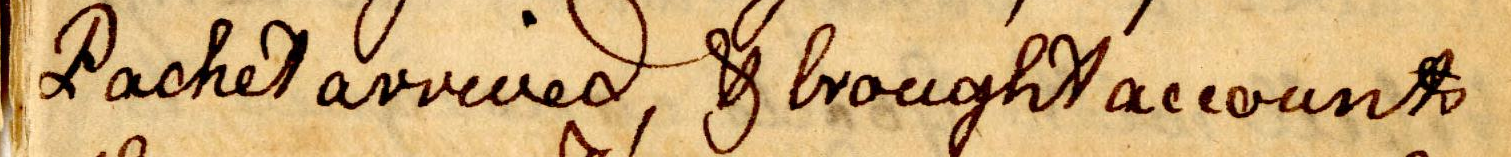Pachet arrived, & brought accounts
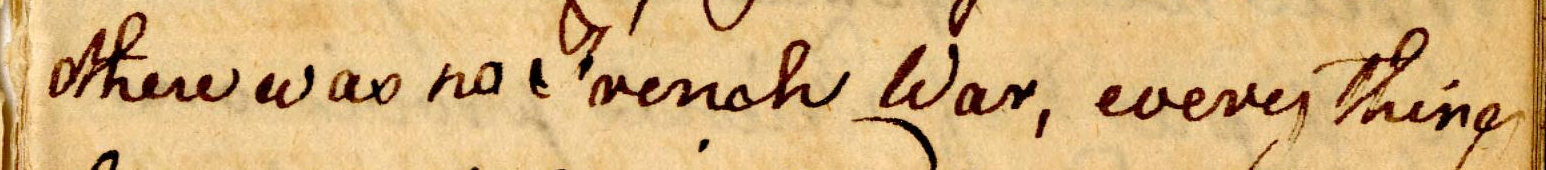there was no French War, every thing
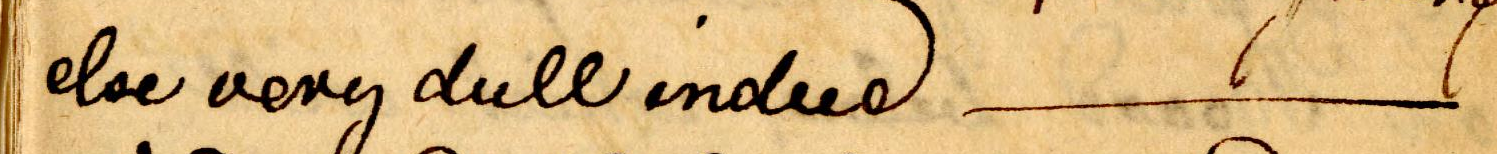else very dull indeed-
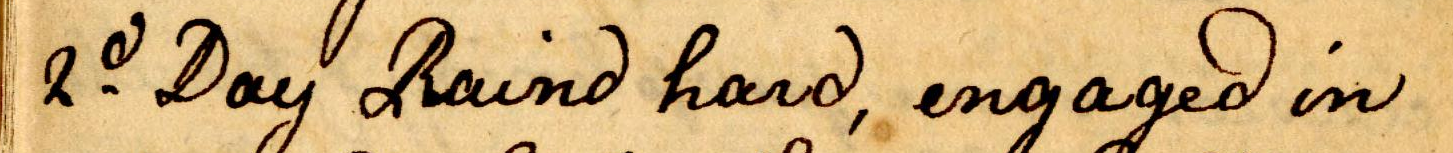2^d. Day Raind hard, engaged in
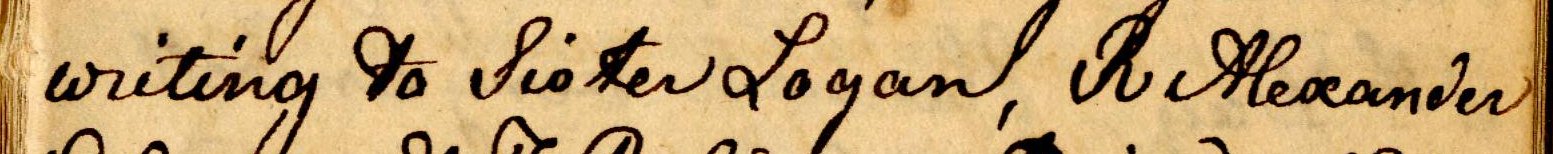writing to Sister Logan, R Alexander
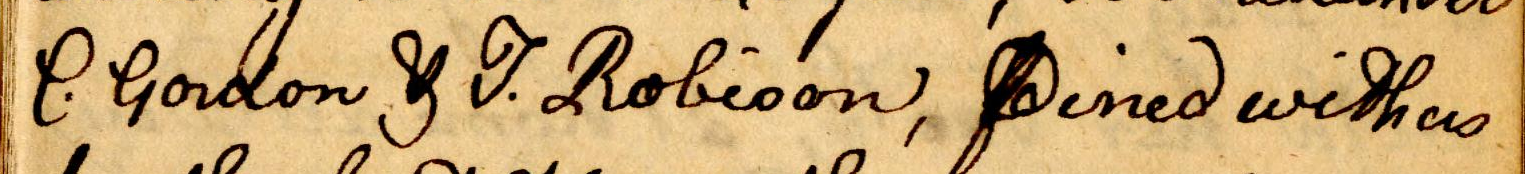C. Gordon & T. Robison, Dined with us
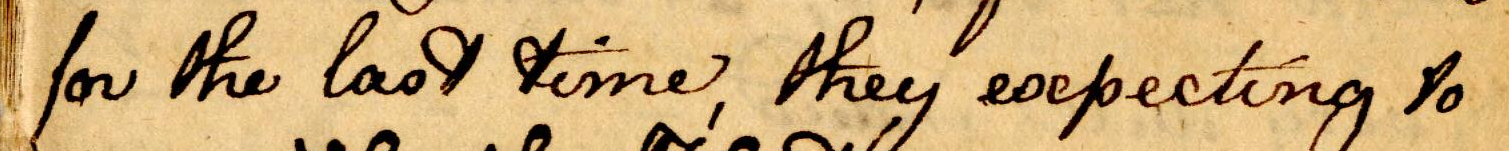for the last time, they expecting to
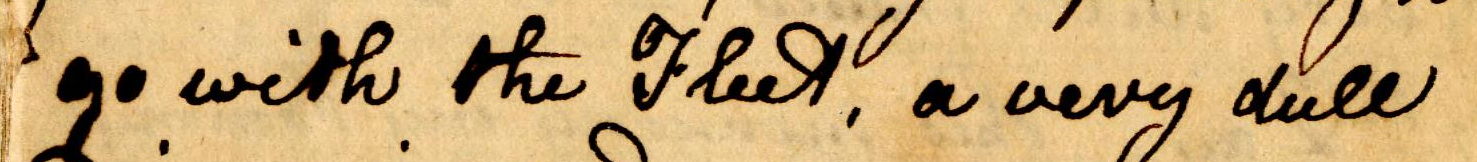go with the Fleet, a very dull
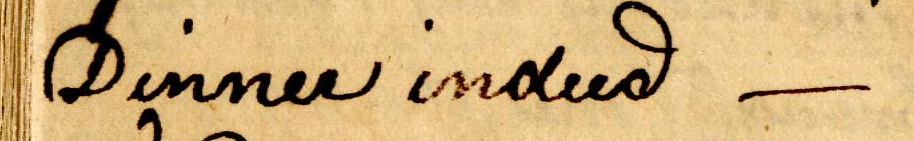Dinner indeed-
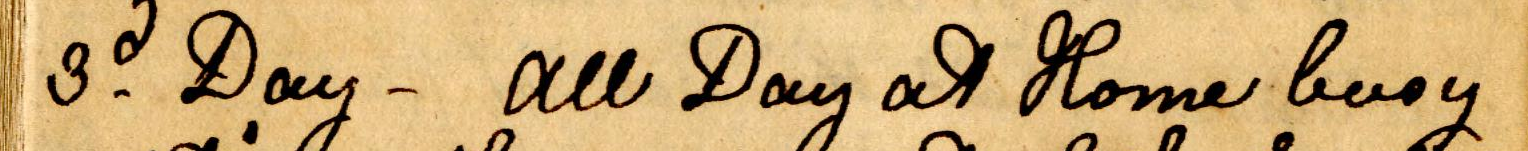3^d. Day- all Day at Home busy
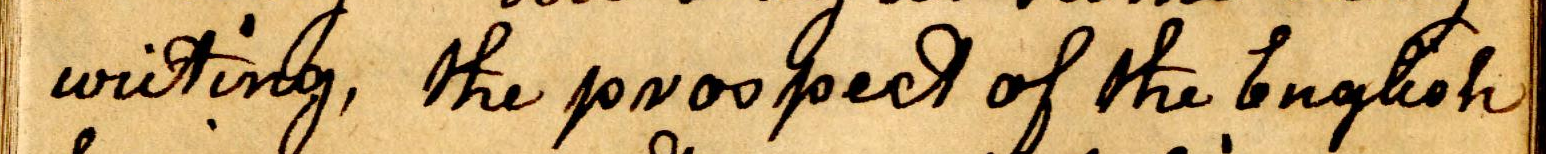writing, the prospect of the English
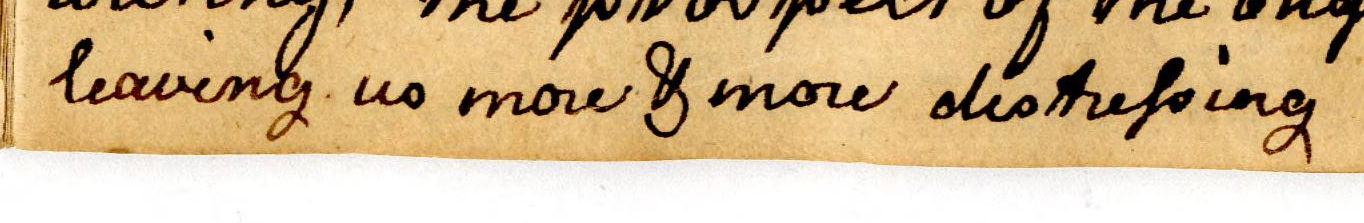leaving us more & more distressing
